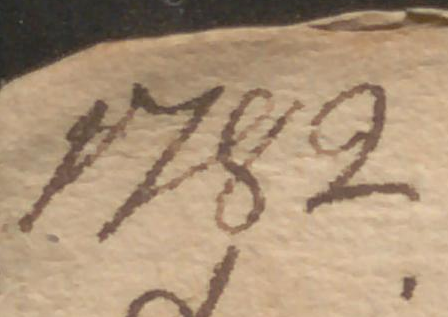1782
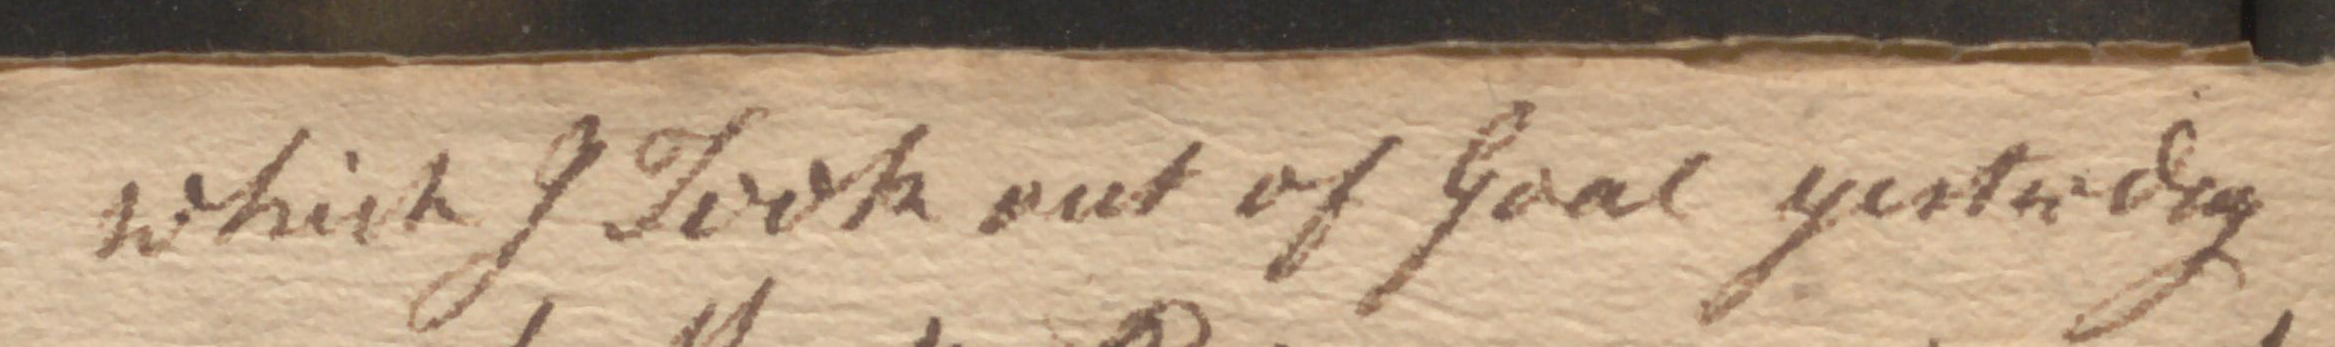which I Took out of Goal yesterday
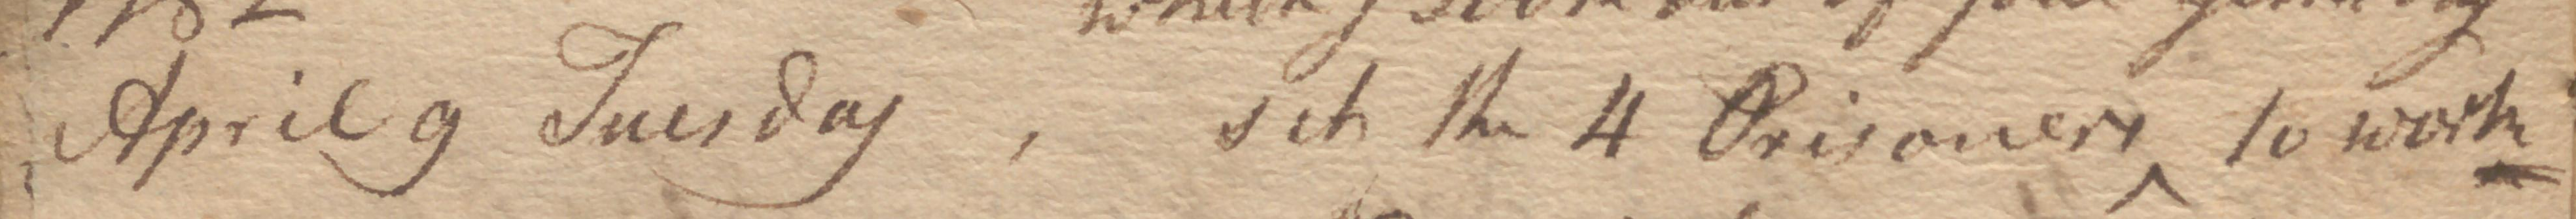April 9 Tuesday, set the 4 Prisoners ^ to work
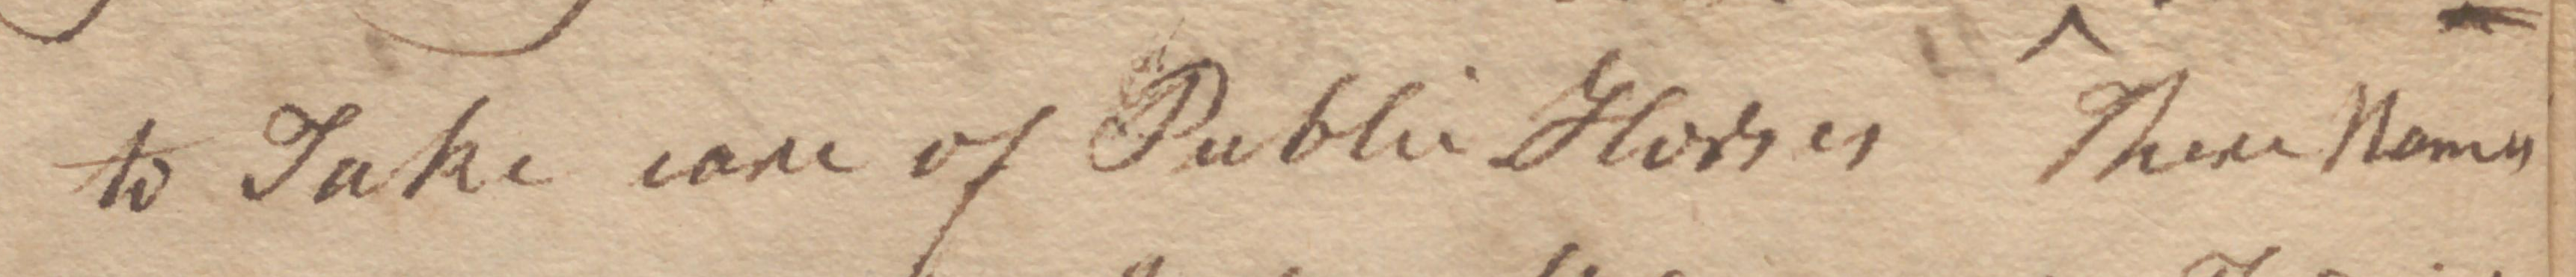to Take care of Public Horses There Names
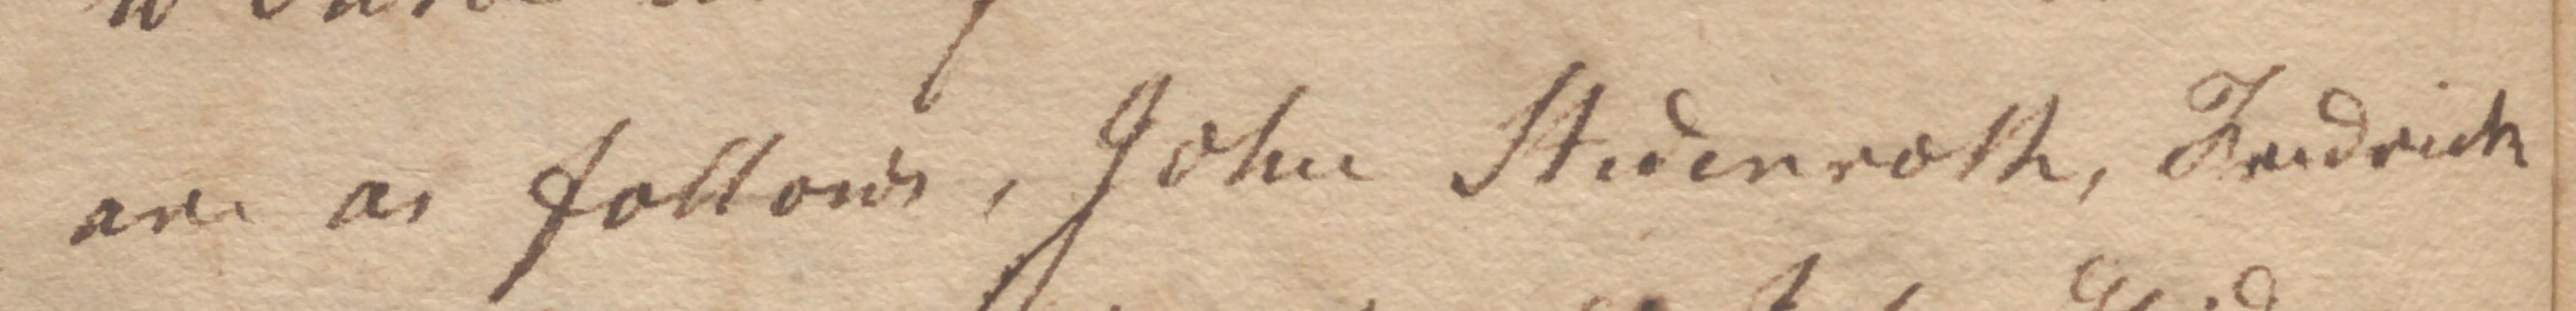are as follows, John Stedenroth, Fredrick
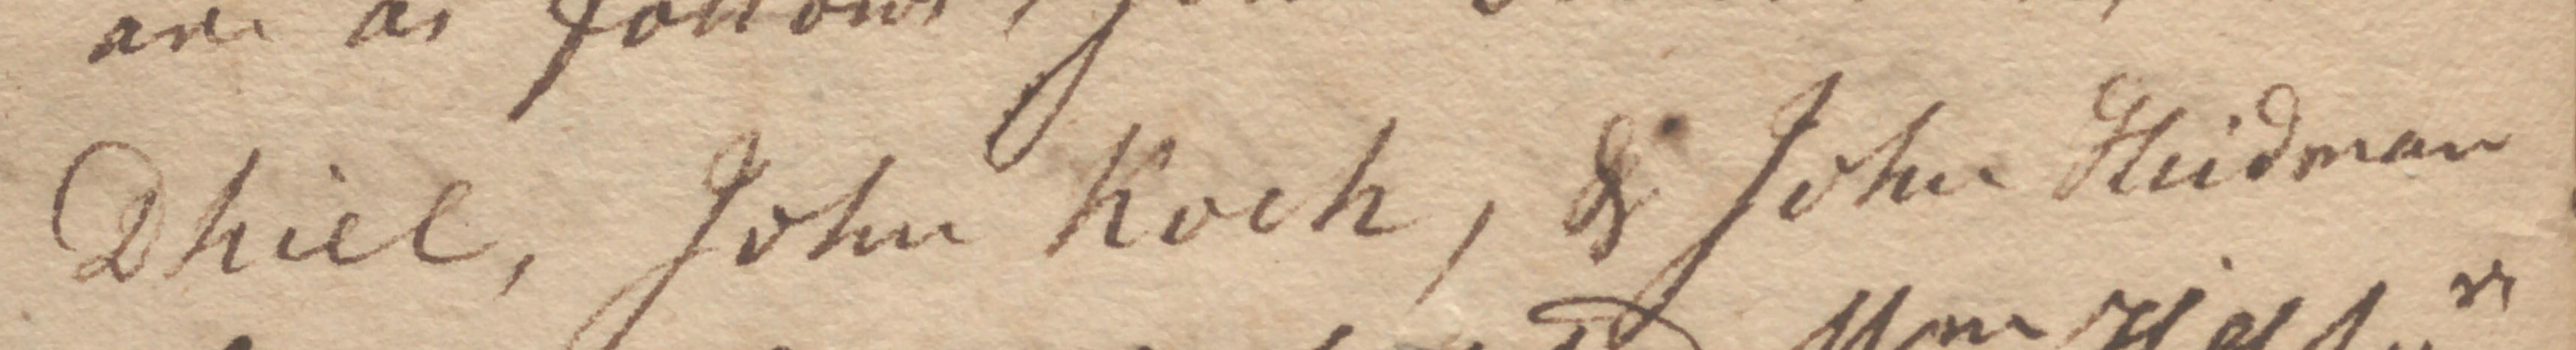Dhiel, John Kock, & John Heidman
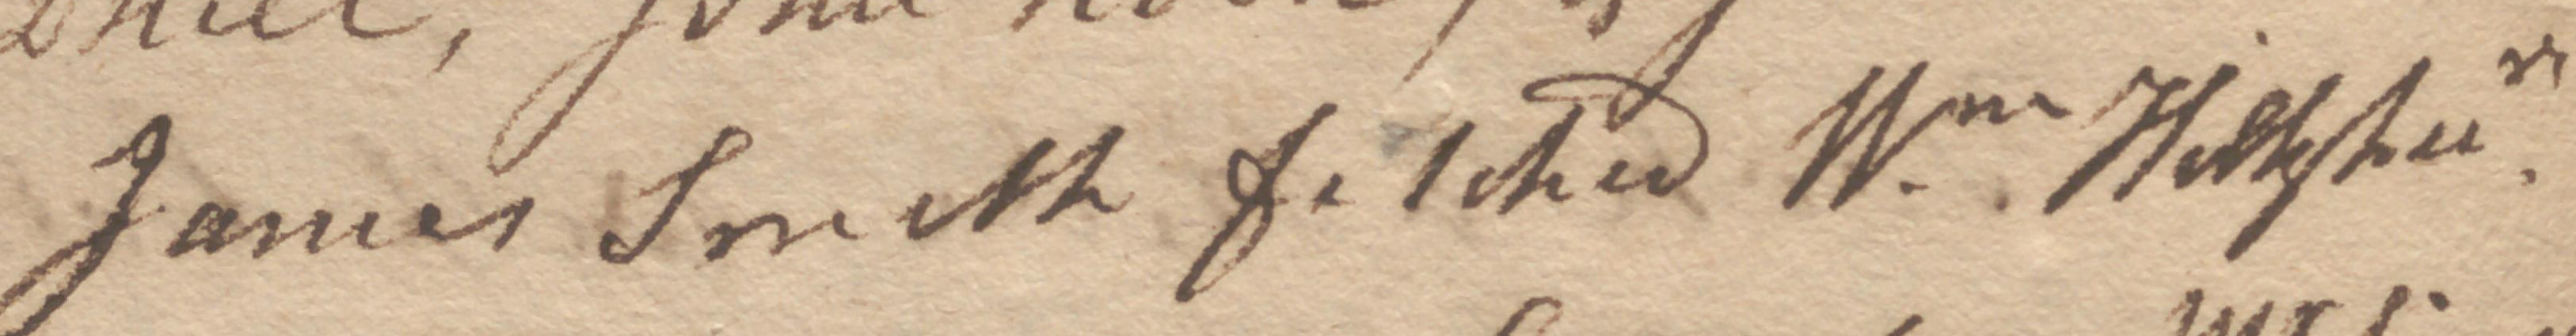James Smith fetched W^m. Hiltzhei^r
